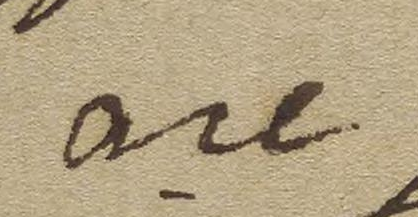are
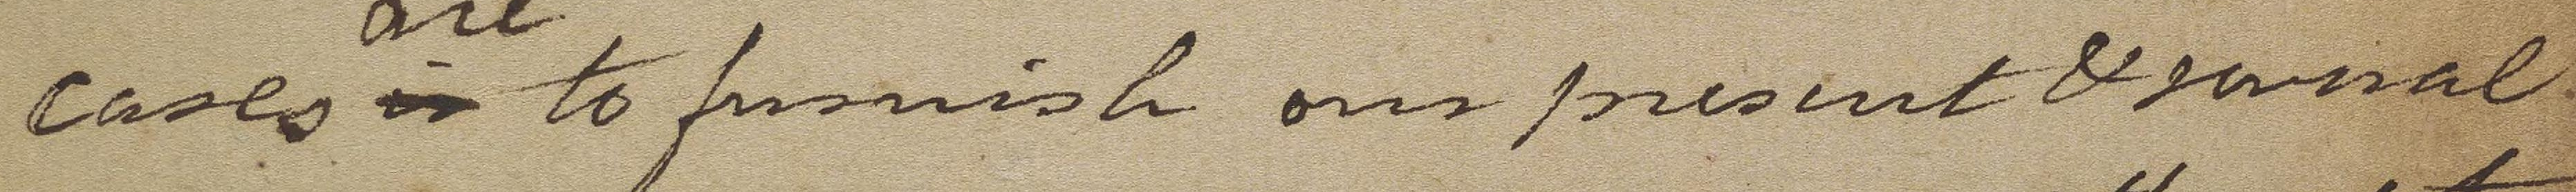cases [is] ^are to furnish our present & several
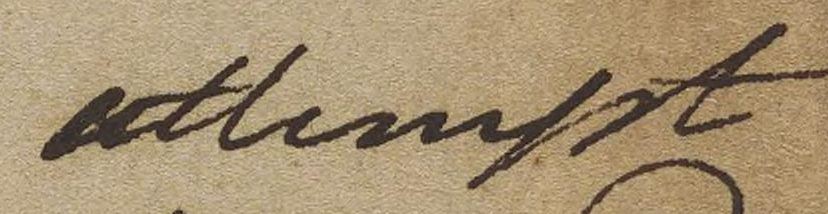attempt
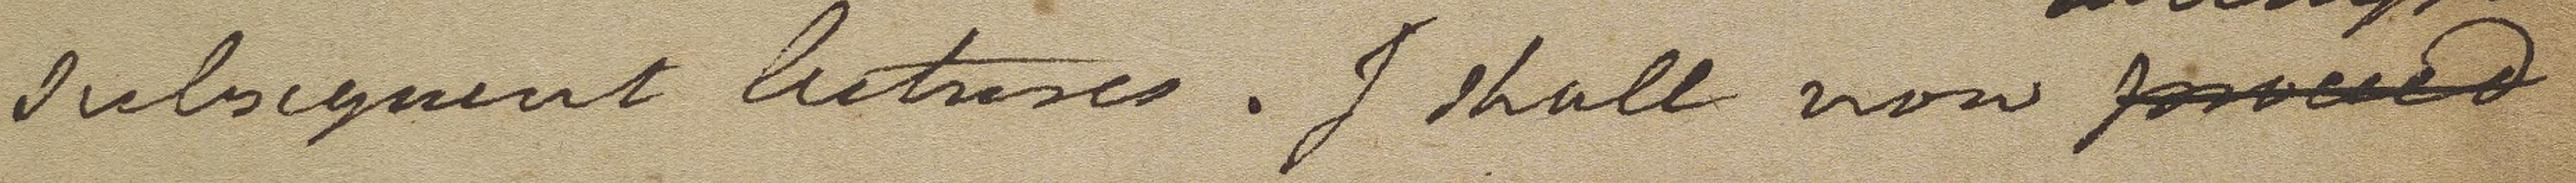subsequent lectures. I shall now [proceed]
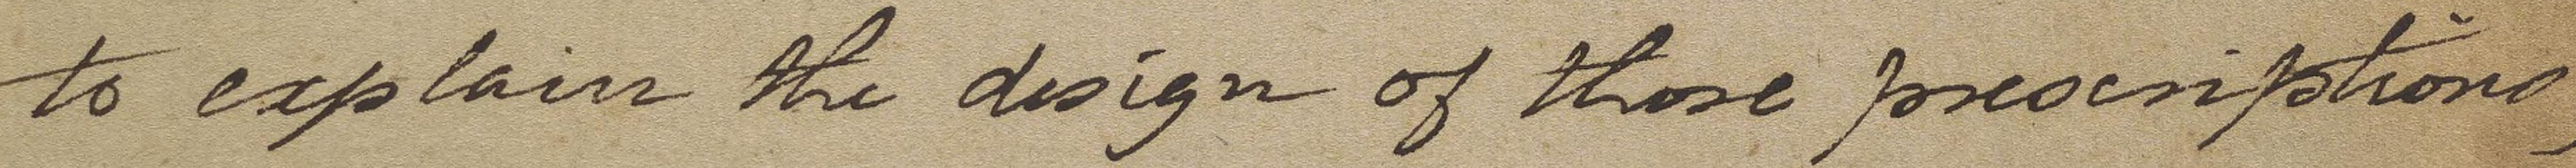to explain the design of those prescriptions
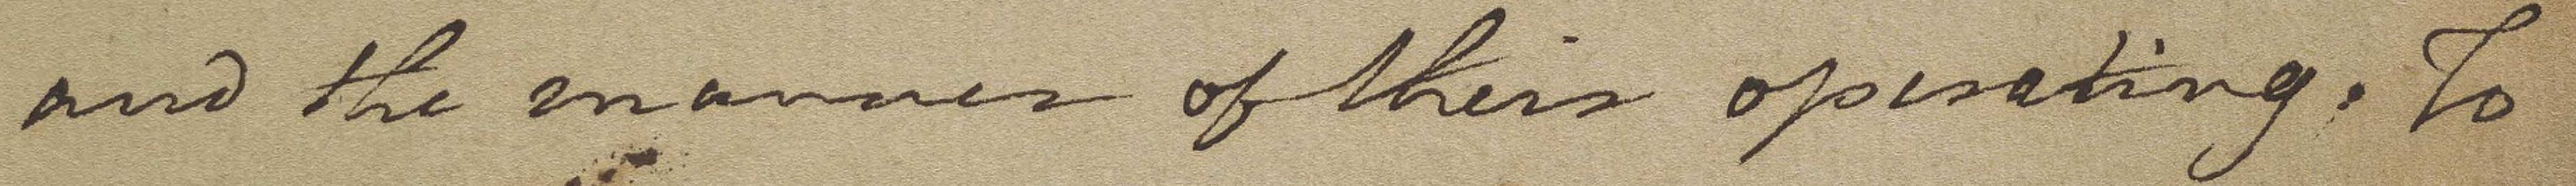and the manner of their operating. To
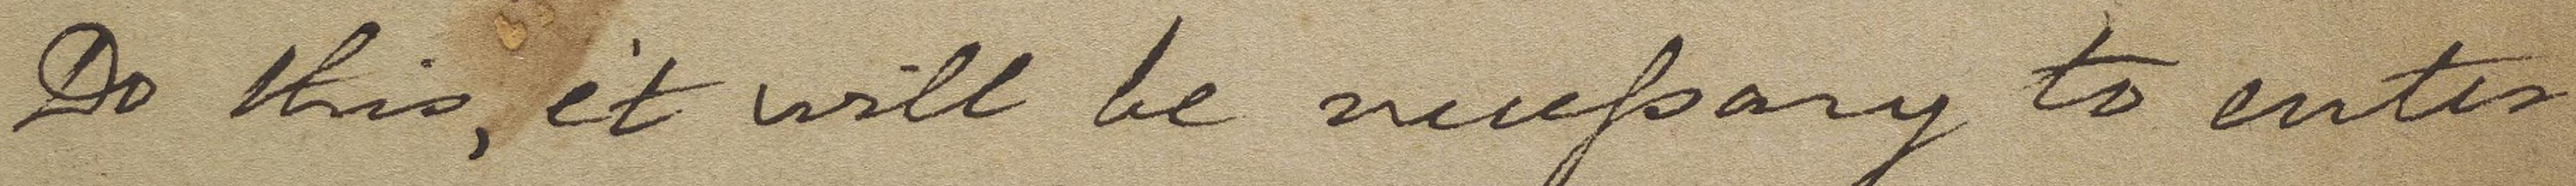do this, it will be necessary to enter
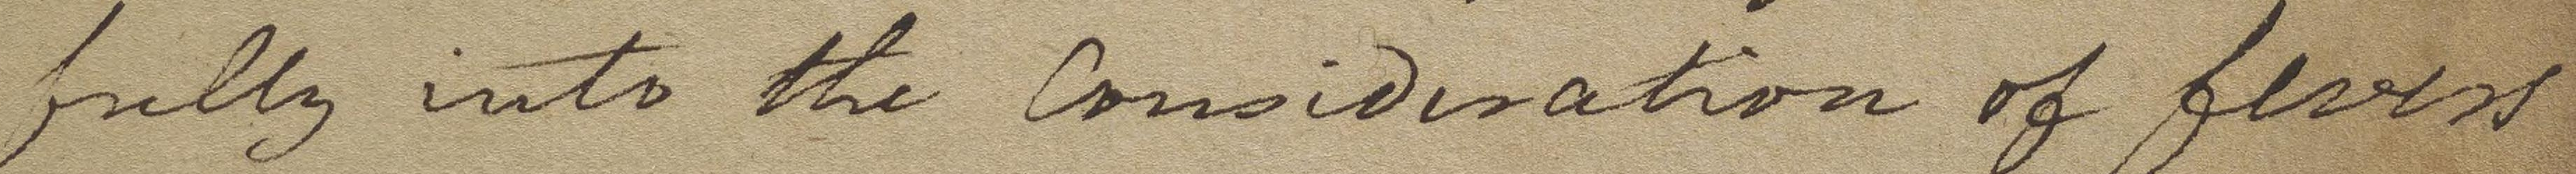fully into the consideration of fevers
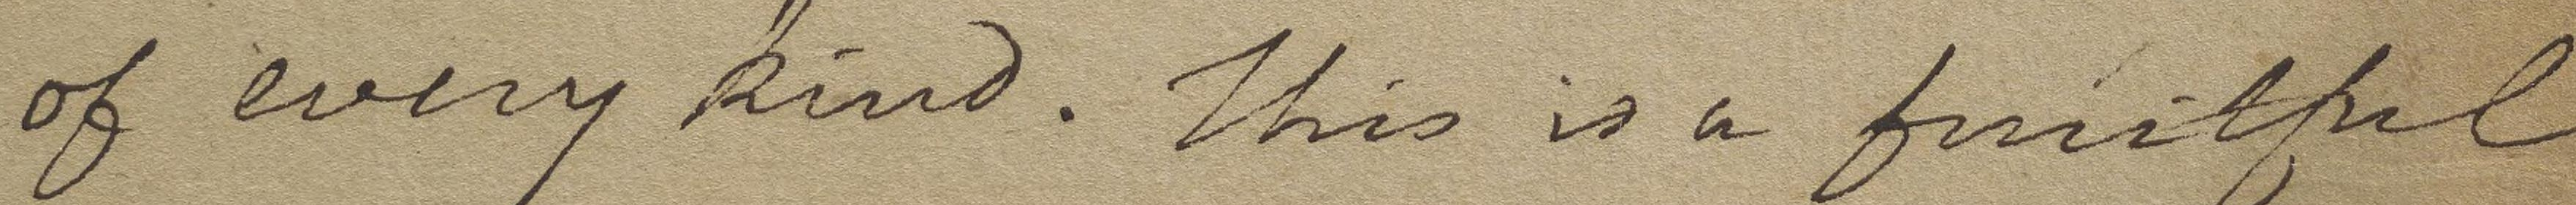of every kind. This is a fruitful
